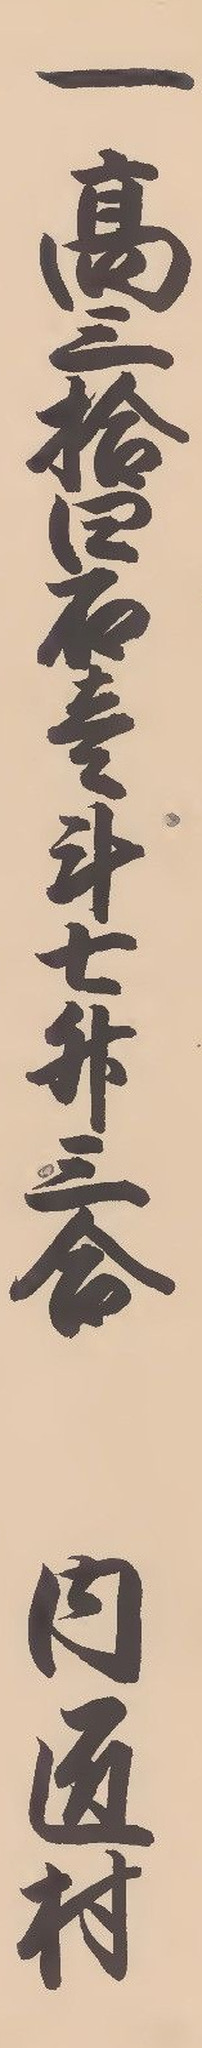一高三拾四石壱斗七升三合内匠村
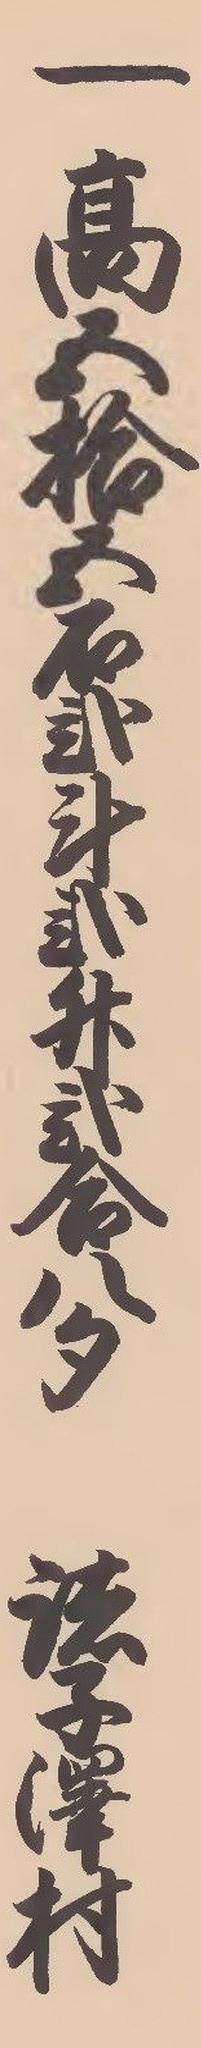一高五拾五石弐斗弐升弐合八勺諸子沢村
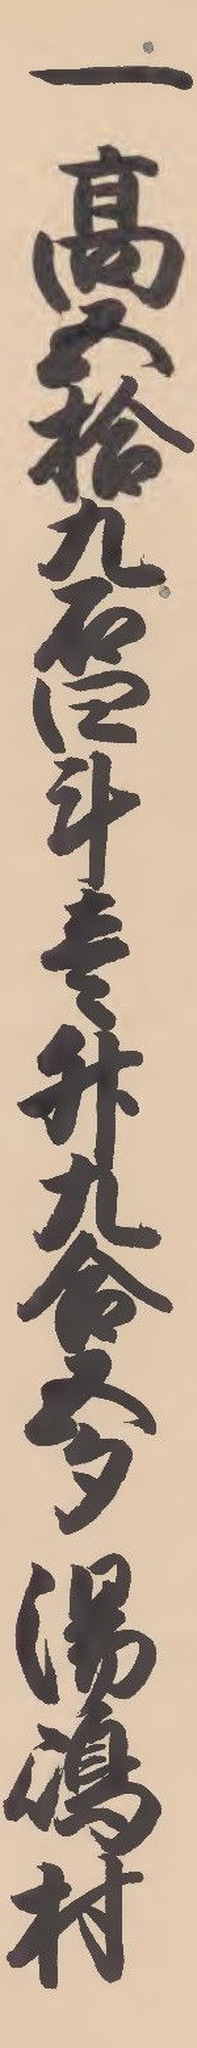一高五拾九石四斗壱升九合五勺湯島村
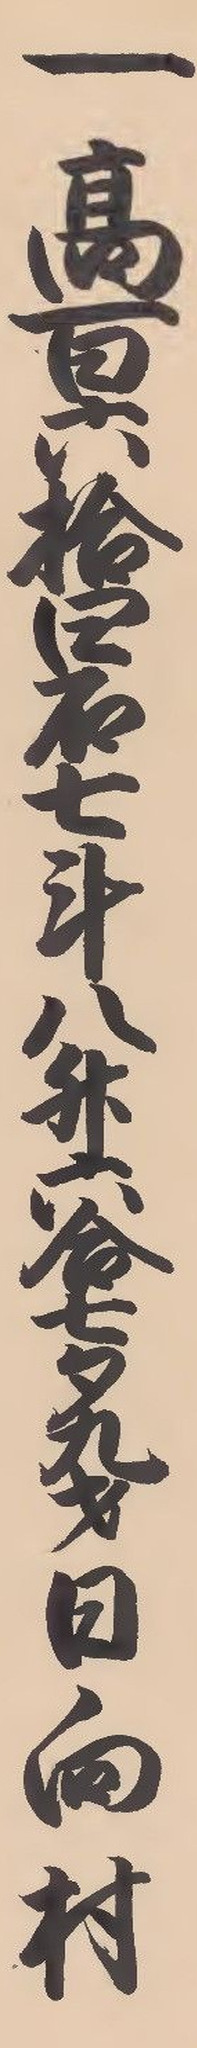一高百六拾四石七斗八升六合七勺九才日向村
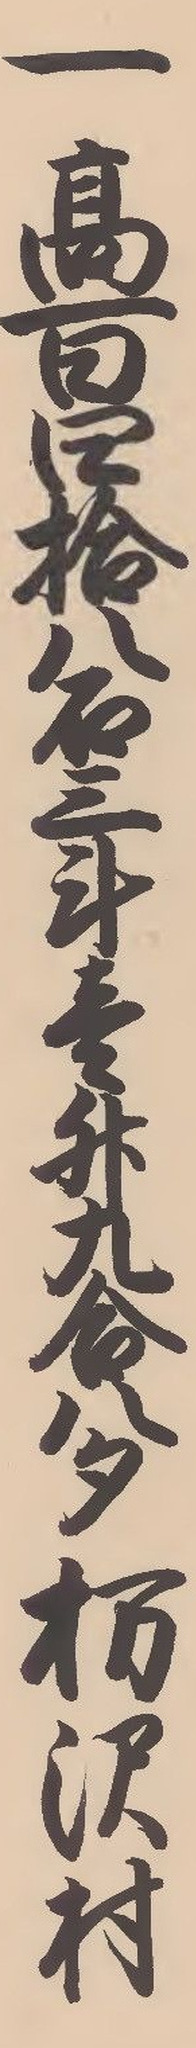一高百四拾八石三斗壱升九合八勺栃沢村
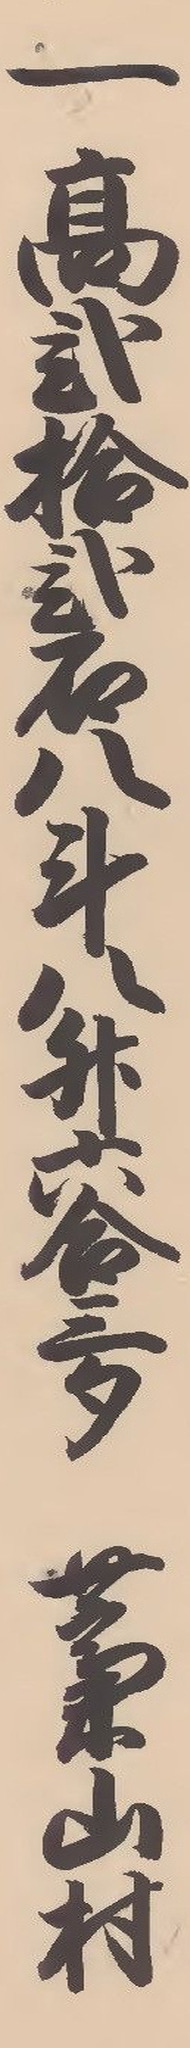一高弐拾弐石八斗八升六合三勺藁山村
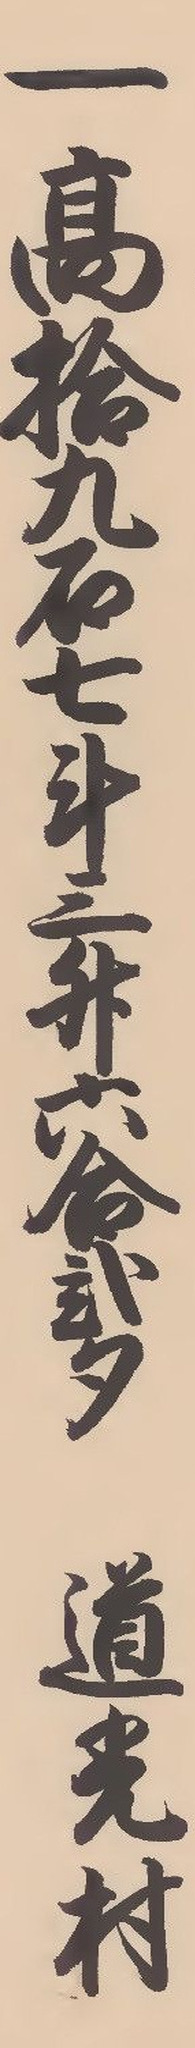一高拾九石七斗三升六合弐勺道光村
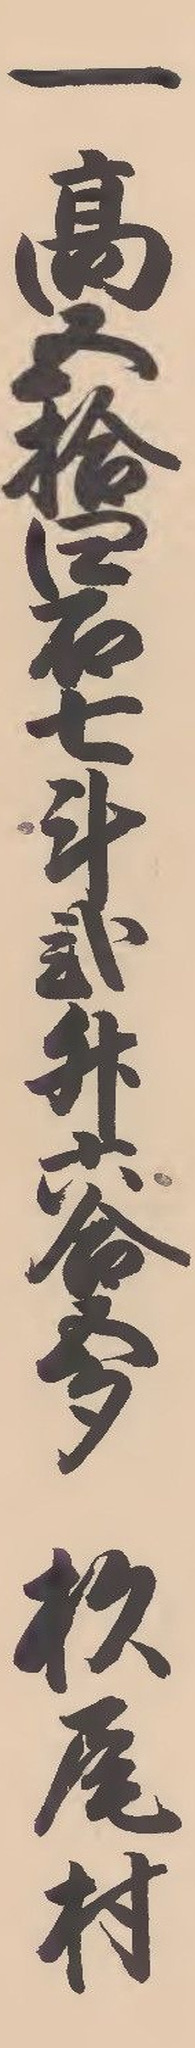一高五拾四石七斗弐升六合五勺杉尾村

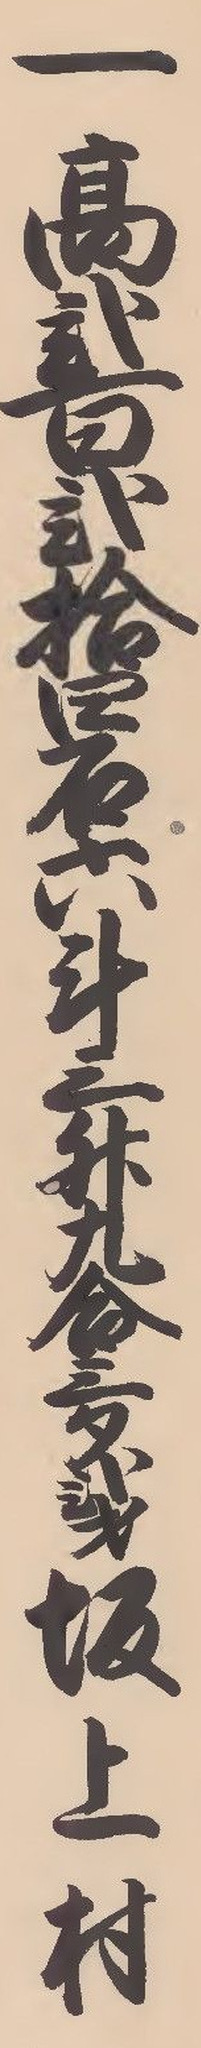一高弐百弐拾四石六斗三升九合三勺弐才坂上村
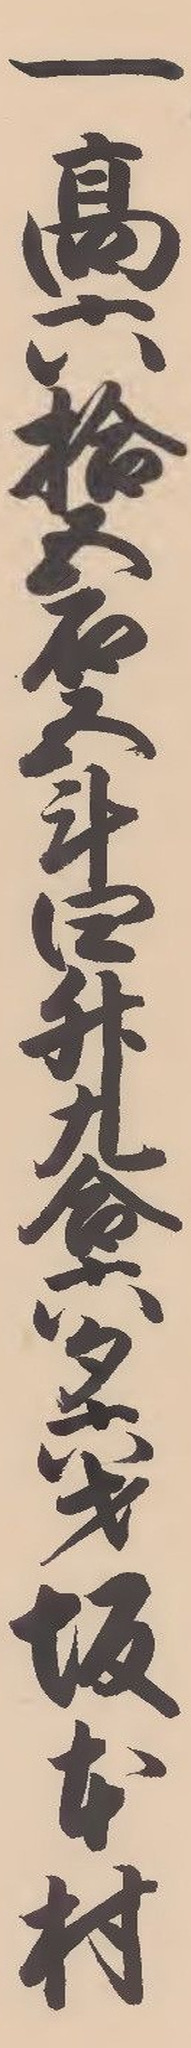一高六拾五石五斗四升九合六勺六才坂本村
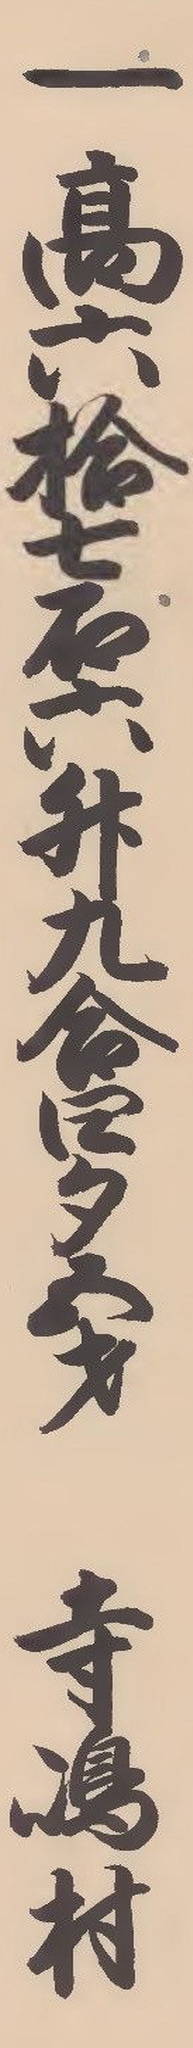一高六拾七石六升九合四勺五才寺島村
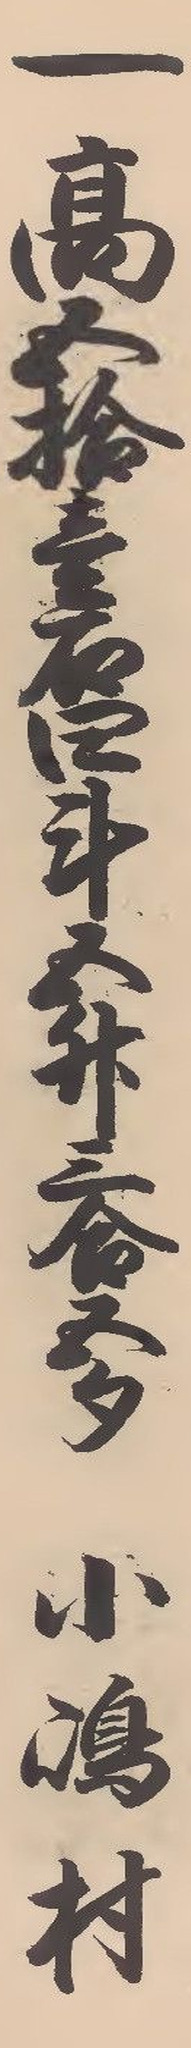一高五拾壱石四斗五升三合五勺小島村
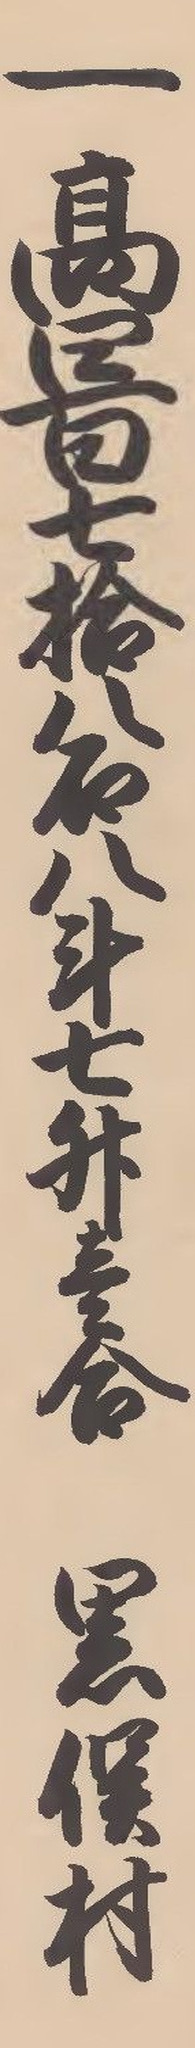一高四百七拾八石八斗七升壱合黒俣村
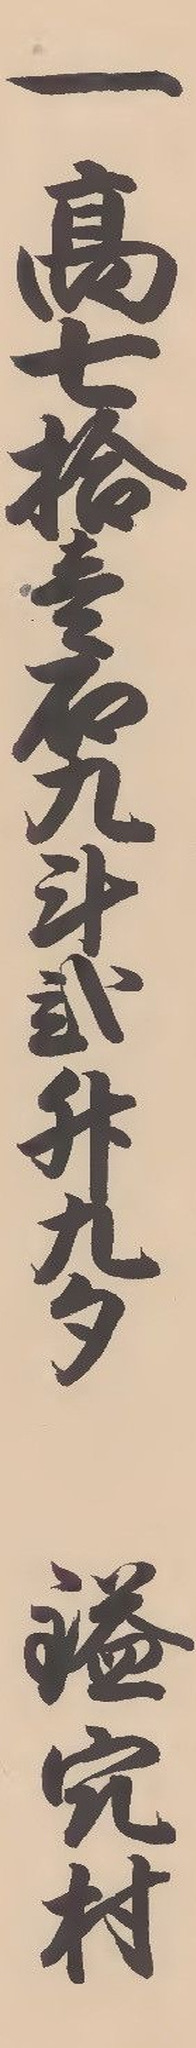一高七拾壱石九斗弐升九勺鎰穴村
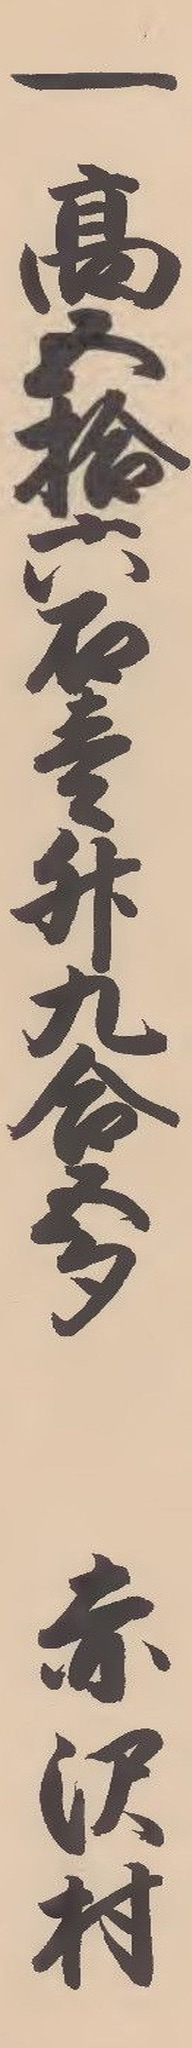一高五拾六石壱升九合五勺赤沢村
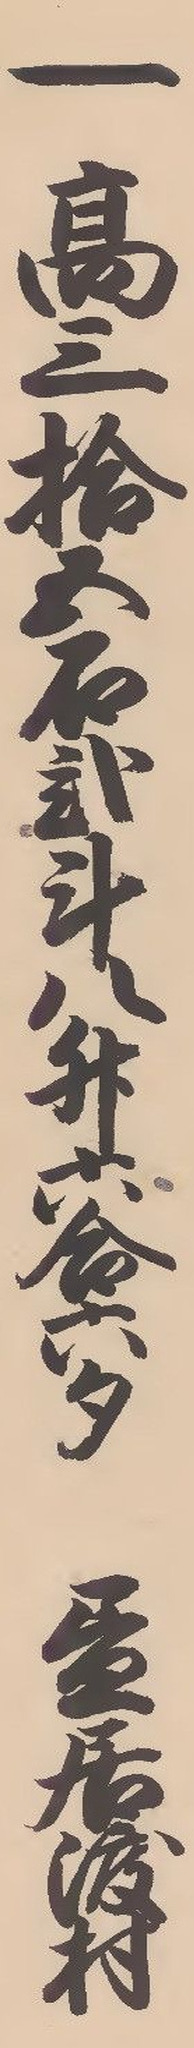一高三拾五石弐斗八升六合六勺昼居渡村
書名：駿河国郷帳
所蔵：国立公文書館 National Archives of Japan
